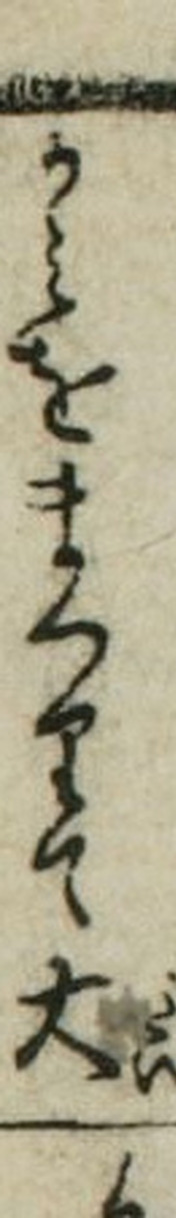かみをまつりて大
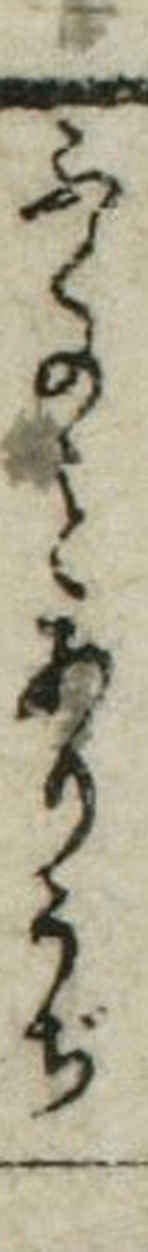ふくのことありうぢ
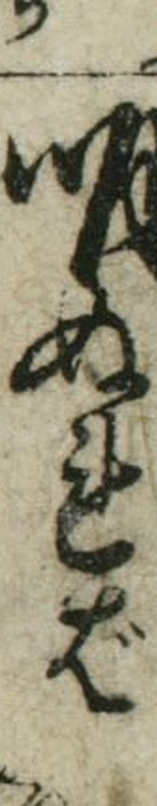明ぬれば
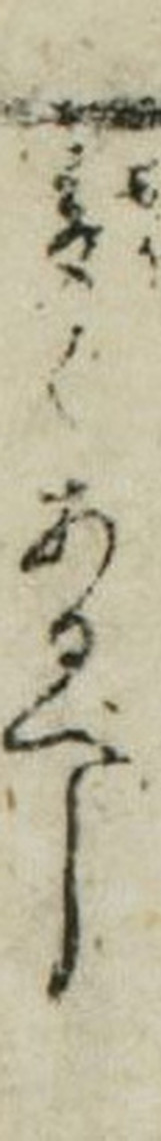多くあるべし
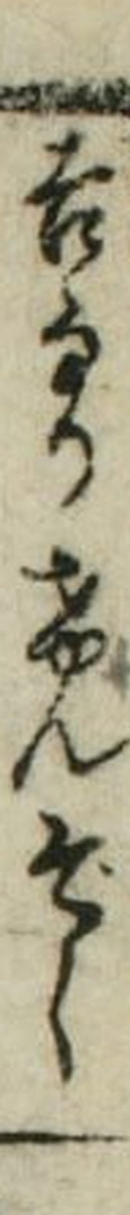吉なりけんぞく
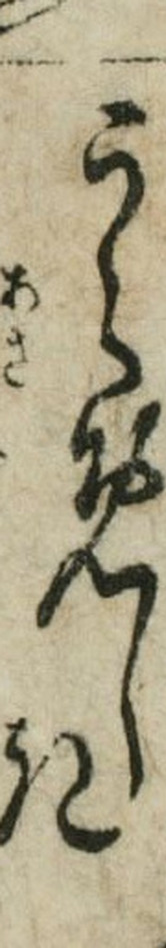うらめしき
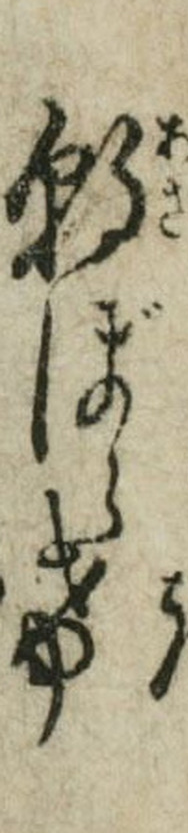朝ぼらけ
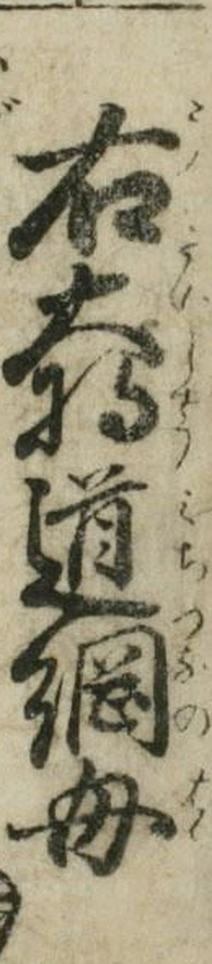右大将道綱母
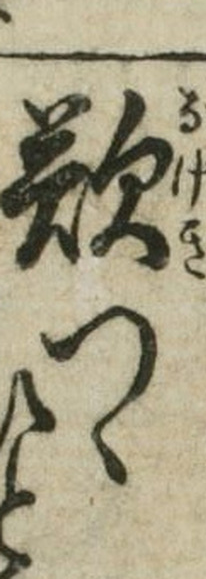歎つゝ
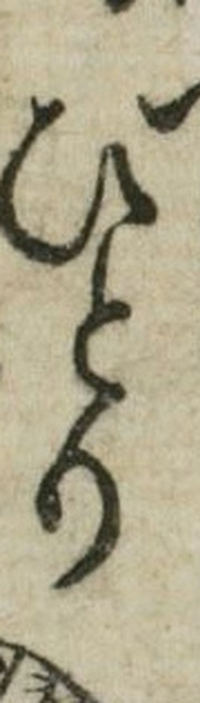ひとり
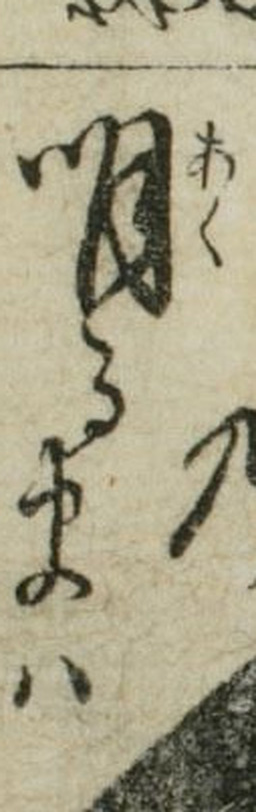明るまは
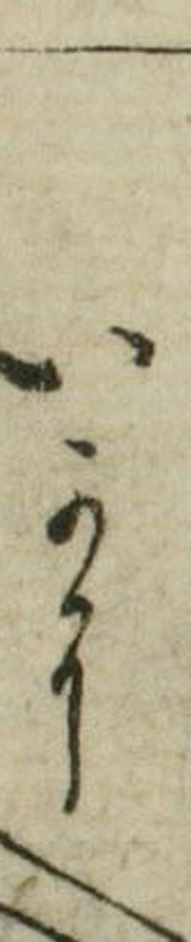いかに
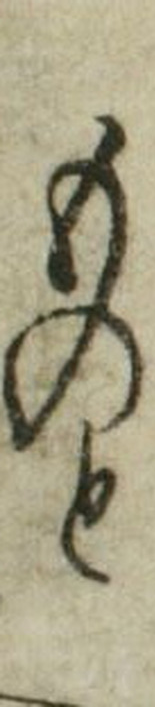ものと

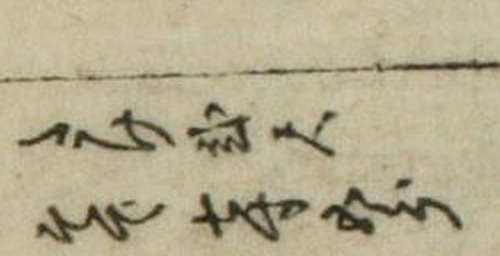たけ弐尺
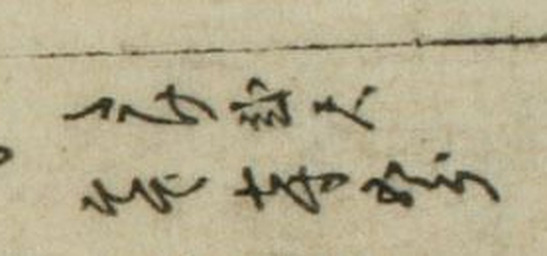たけ弐尺
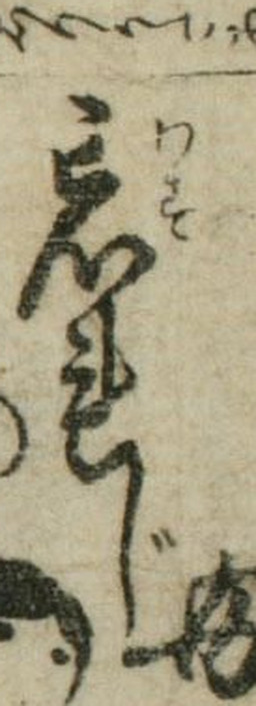忘れじ
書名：百人一首
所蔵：東京学芸大学教育コンテンツアーカイブ
